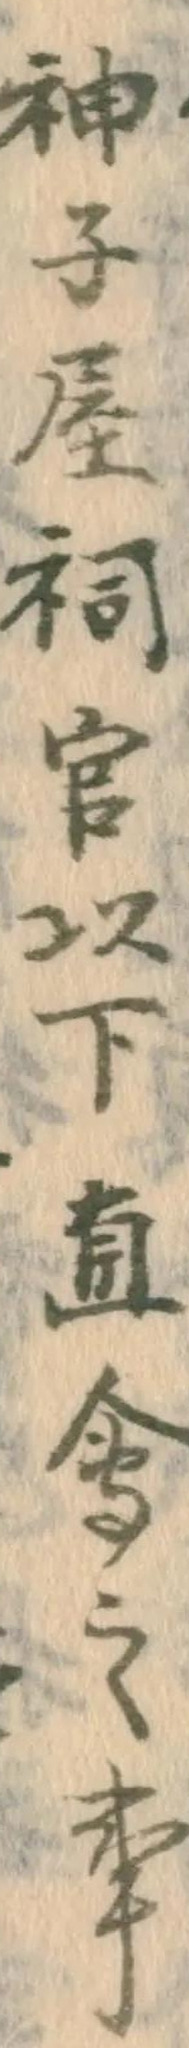神子屋祠官以下直会之事
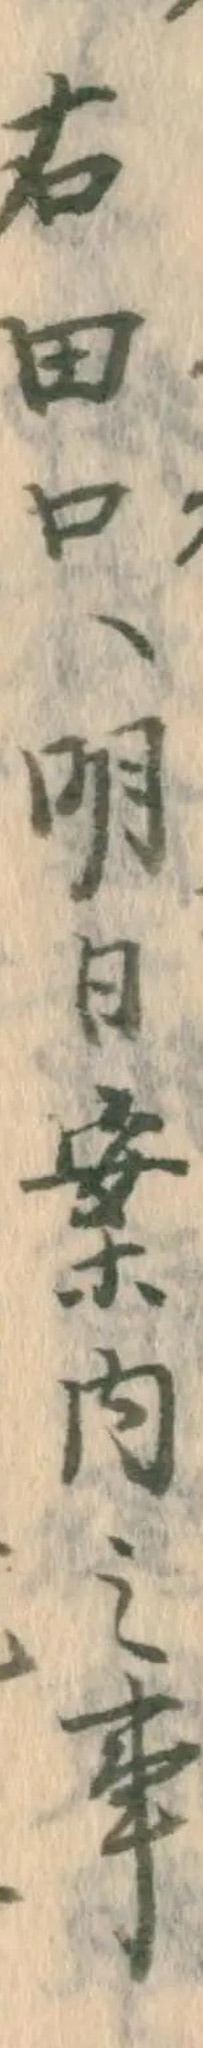右田口へ明日案内之事
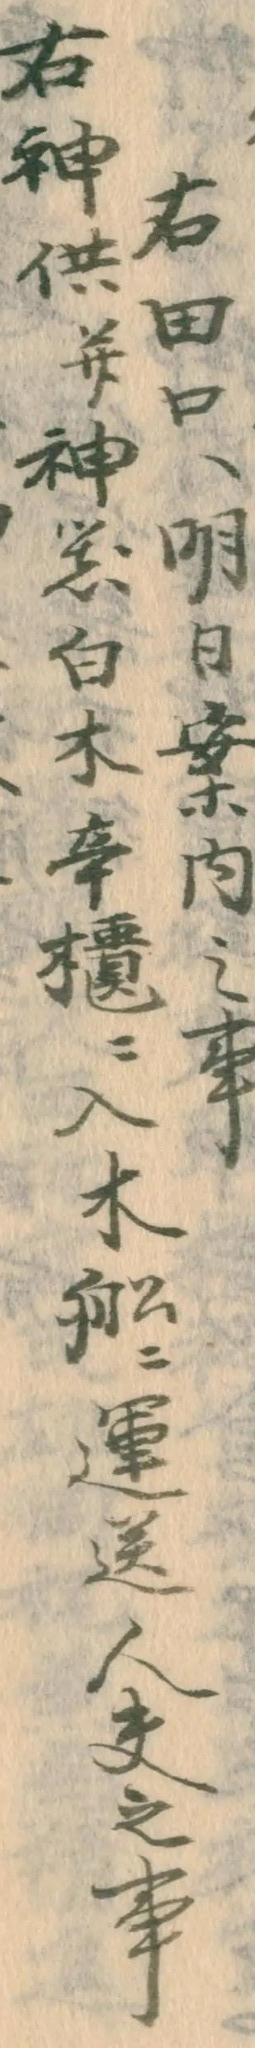右神供并神器白木辛櫃ニ入木船ニ運送人夫之事
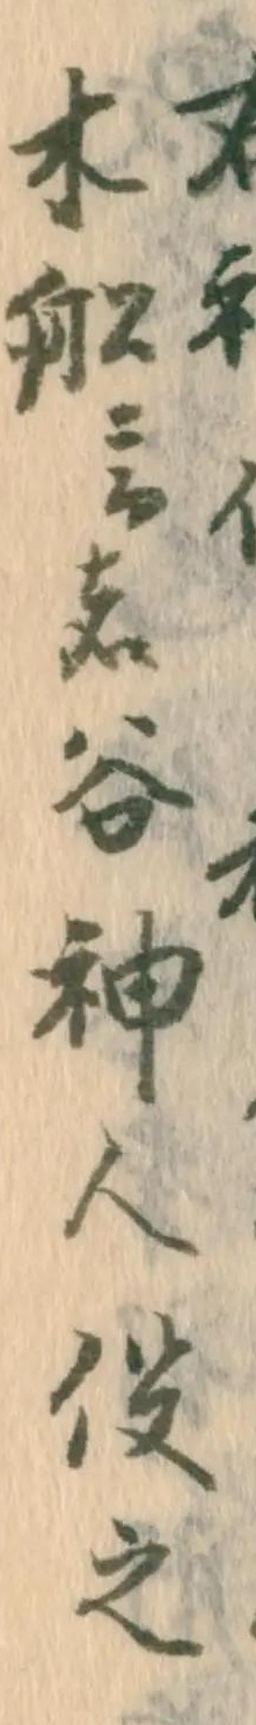木船ニ而は谷神人役之
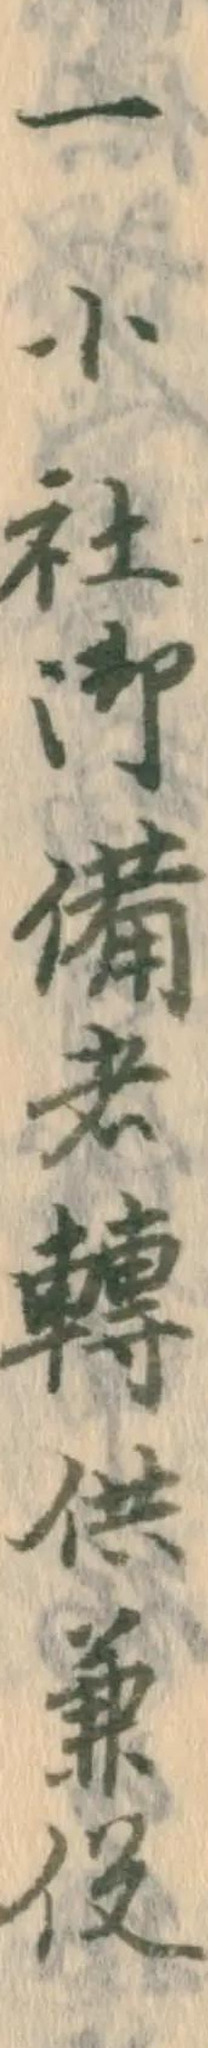一小社御備者転供兼役
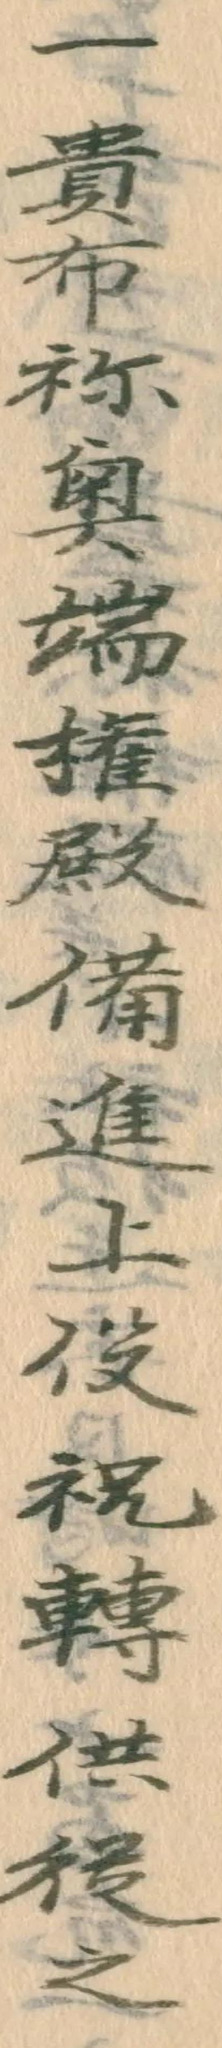一貴布祢奥端権殿備進上役祝転供役之
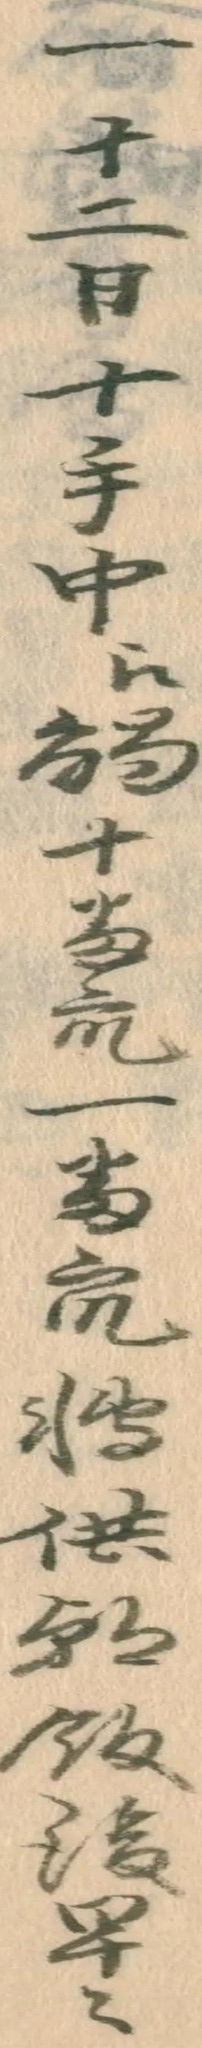一十二日十手中江触十番衆一番衆転供朝飯後早々
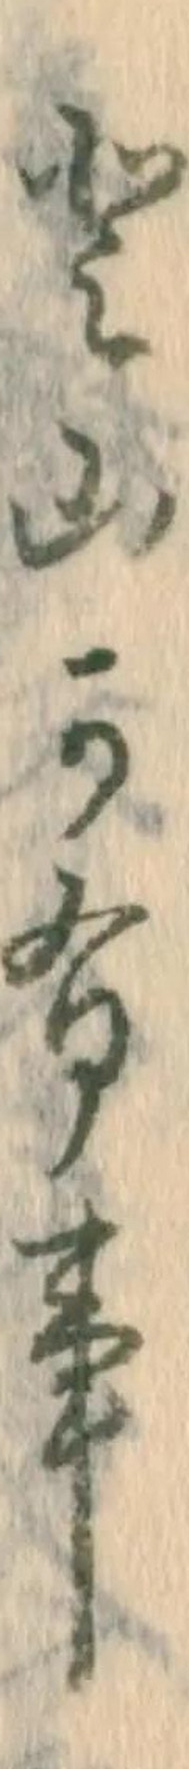登山可有事
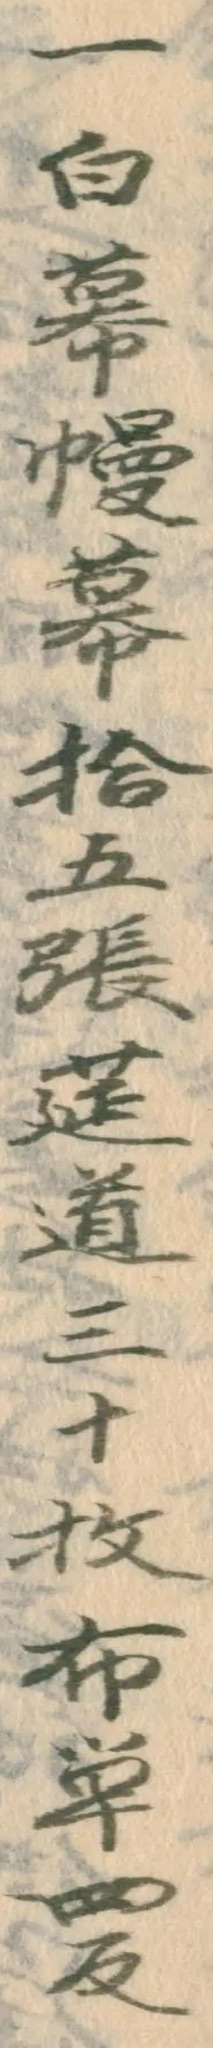一白幕幔幕拾五張筵道三十枚布単四反
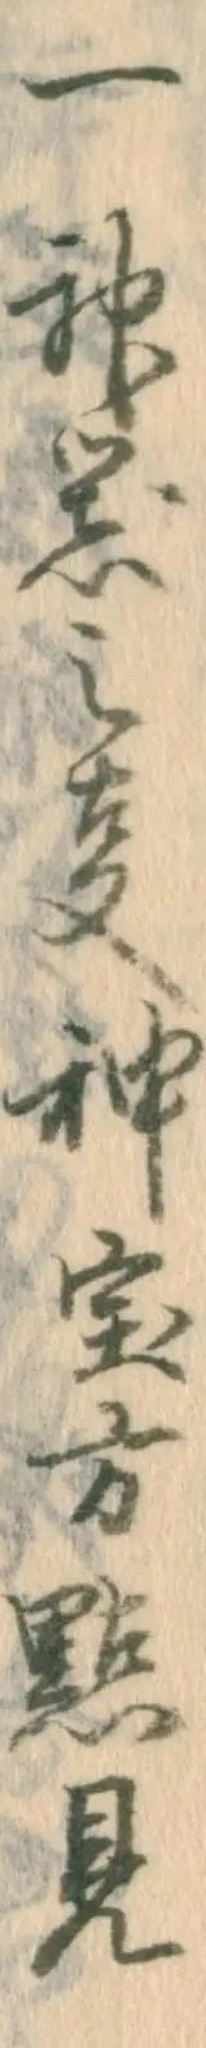一神器之事神宝方点見
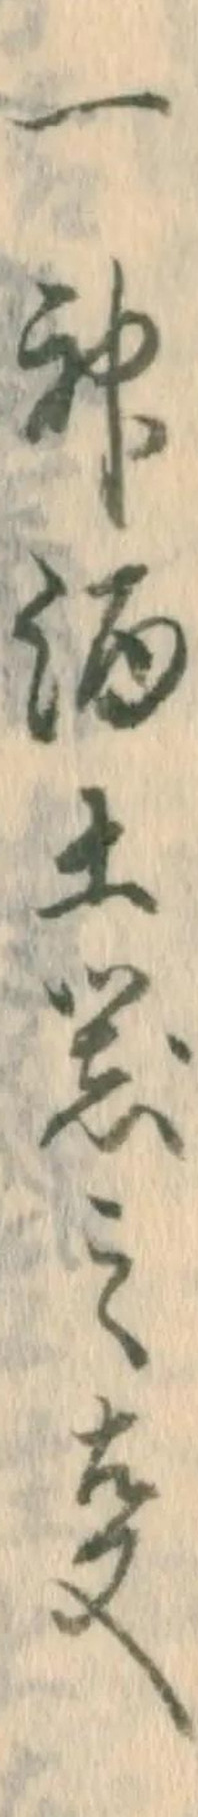一神酒土器之事
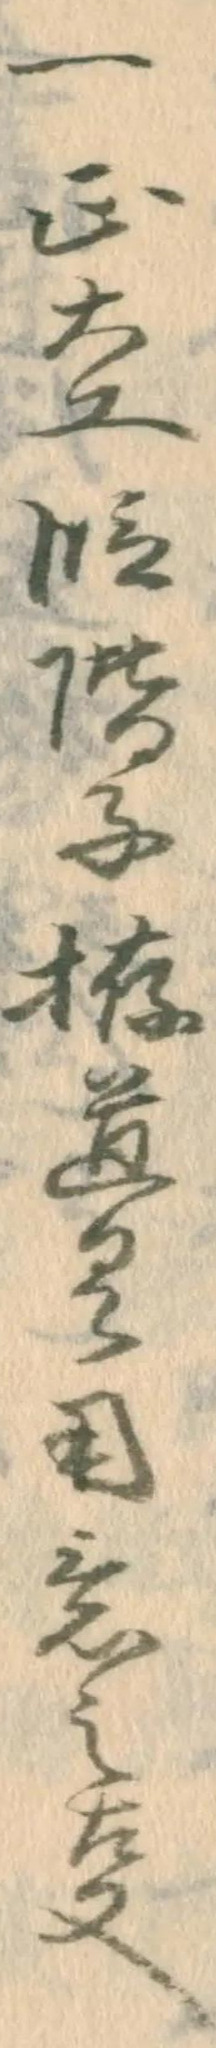一正大工段階子拵道具用意之事
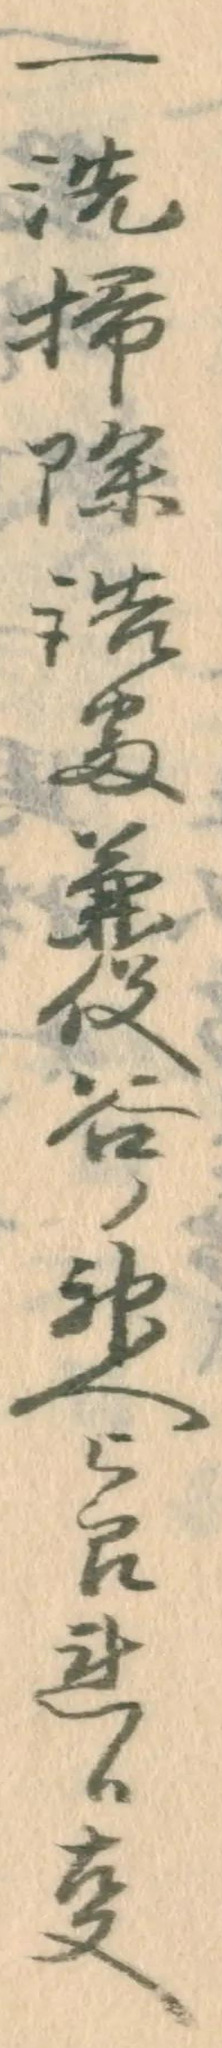一洗掃除詰番兼役谷ノ神人被召連候事
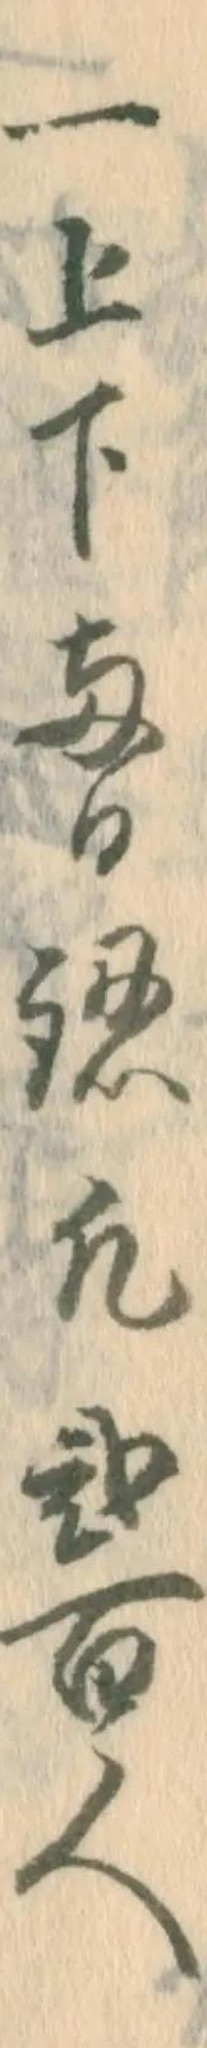一上下両日認凡弐百人

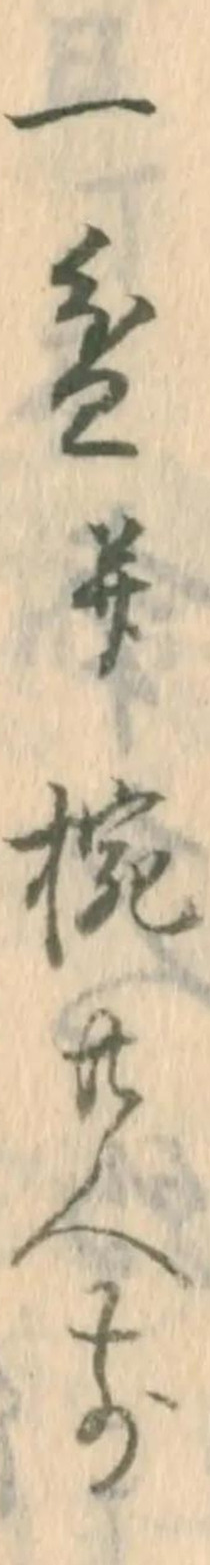一盆并椀廿人前
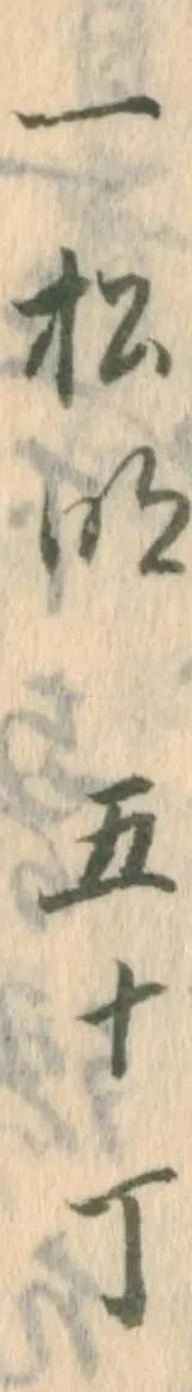一松明五十丁
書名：賀茂社記録. 第17冊
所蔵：国立国会図書館 National Diet Library, JAPAN
